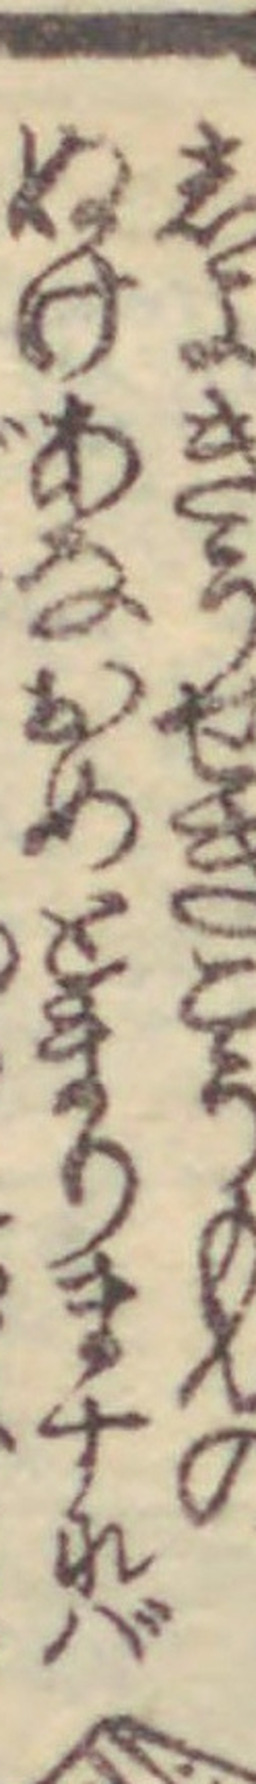ぬけあなおめとまりますれば
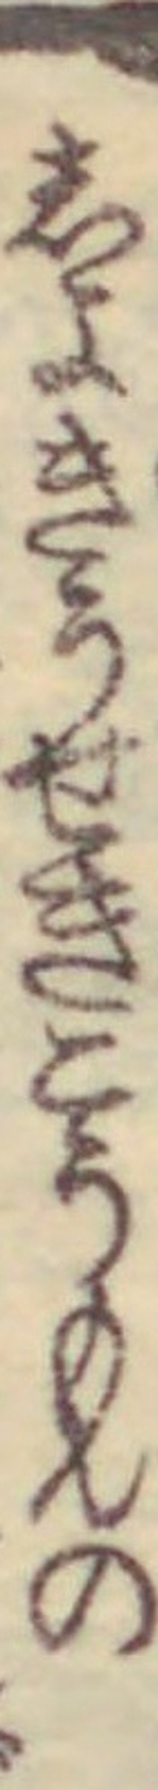しよきうせきこうもんの
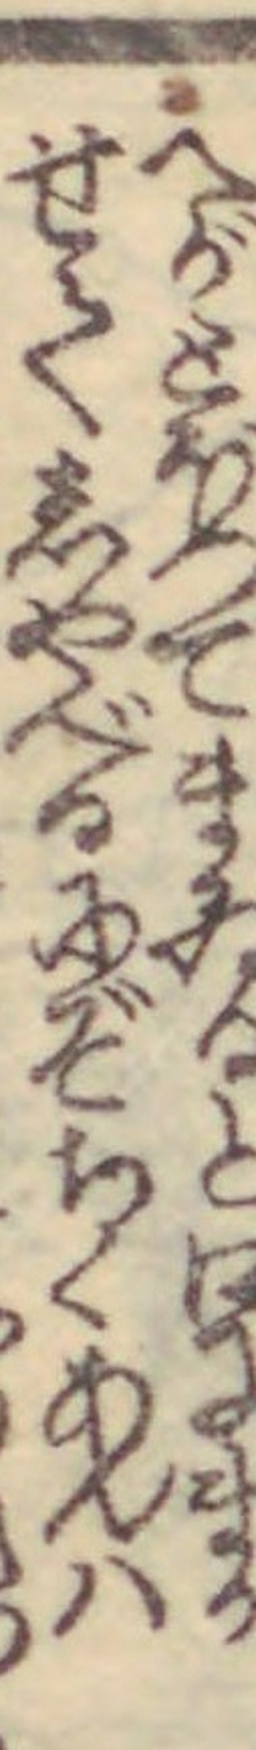せてしやべるにぞちくあんは
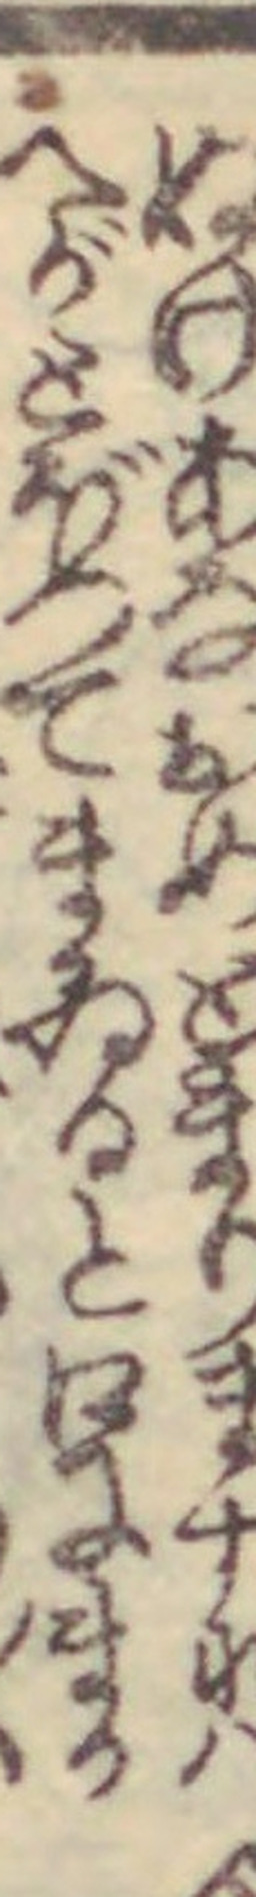へがとぼつてまゐると口にまか
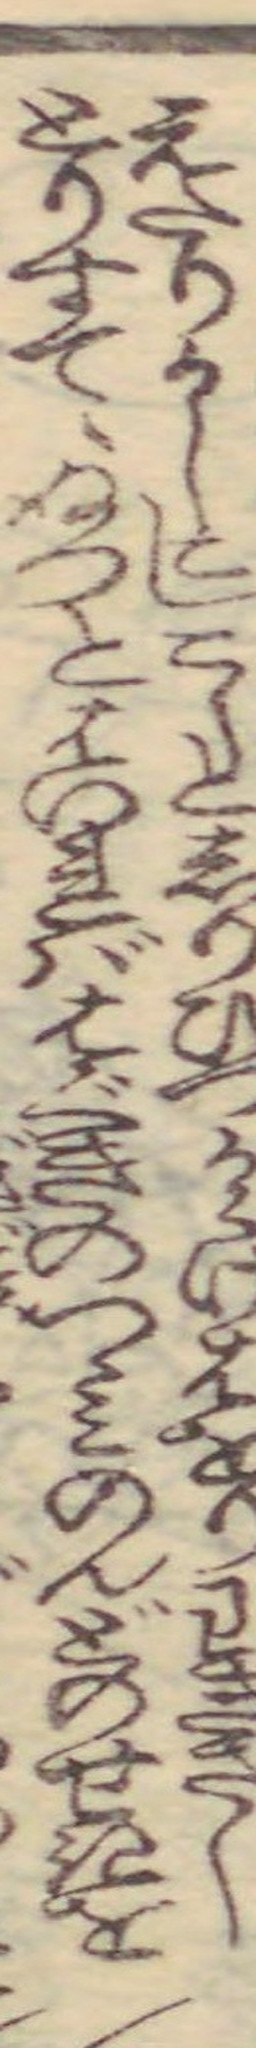とりすてゝぬつとはいればはぐきのつゝみのんどのせきを
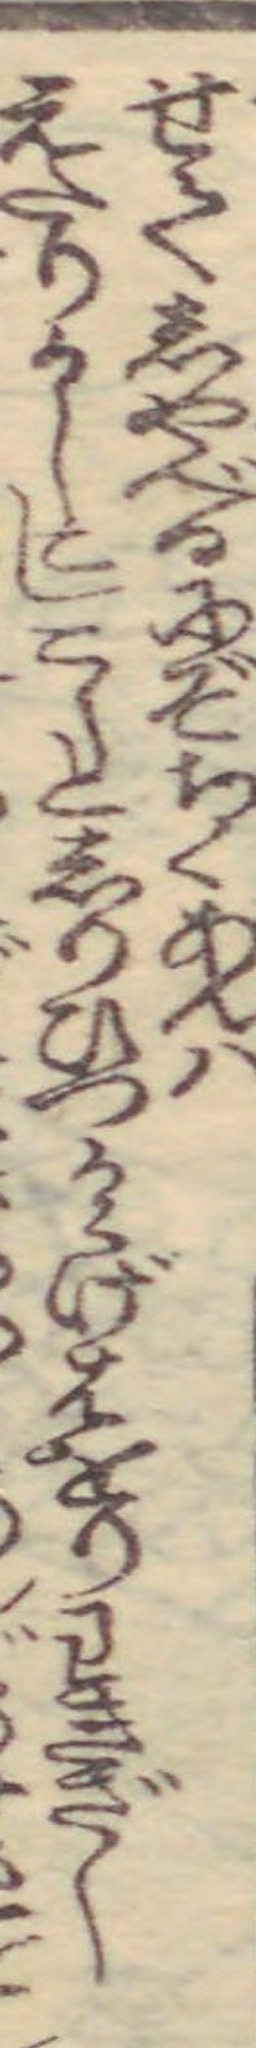えたりかしこしこしとしりひつからげはをりわきざし
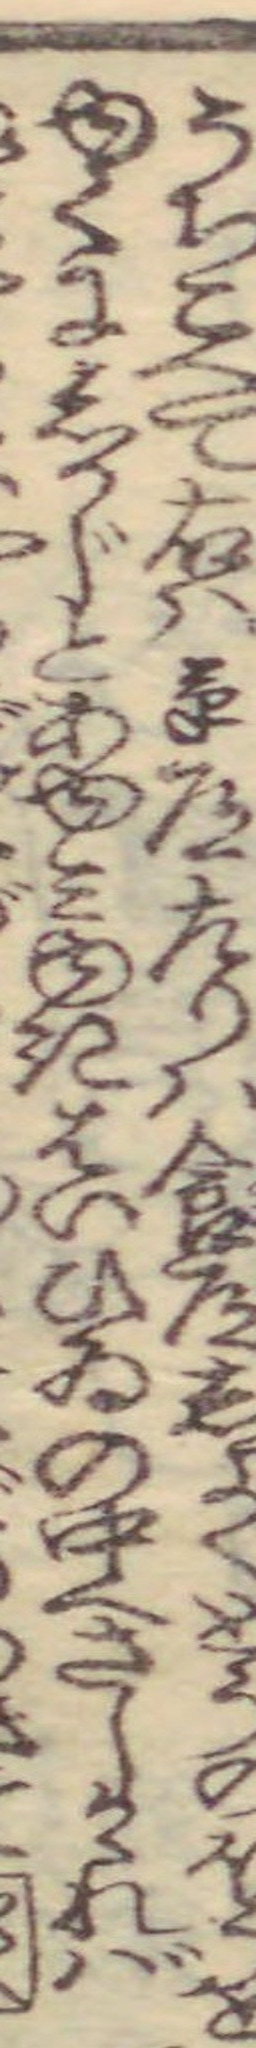ゆくにしかじとあゆみゆきはいひゐいの中へさしかゝれば
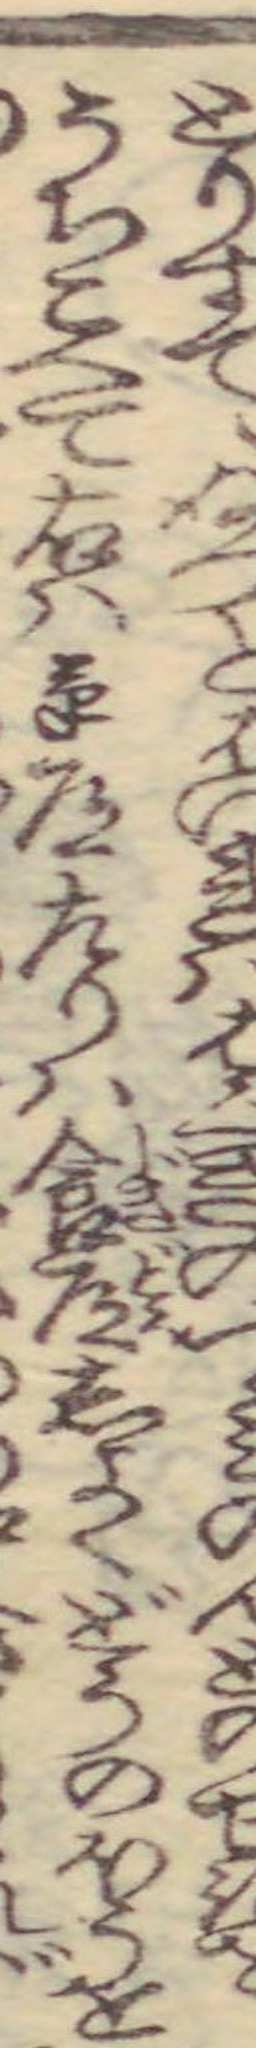うちこへて右は気道左りは食道しよくどうのほうを
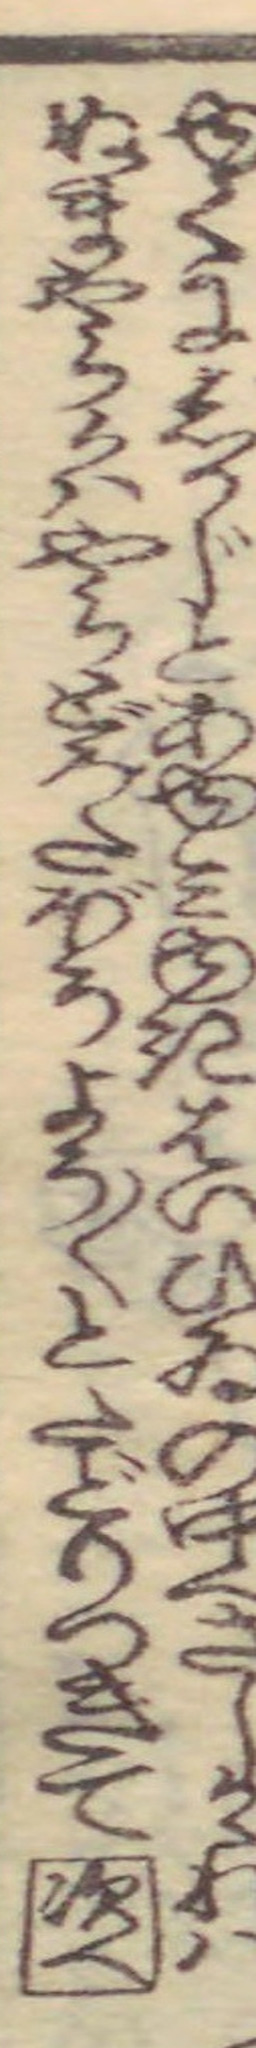ぬまやらかはやらどろたぼうよう〳〵とたどりつきて[次へ]

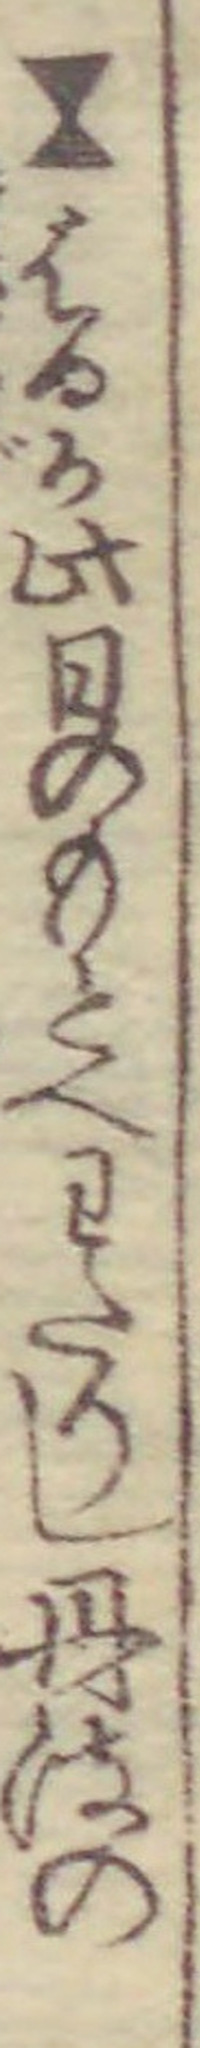▼▲はるか此日のもとへわたりし丹波の
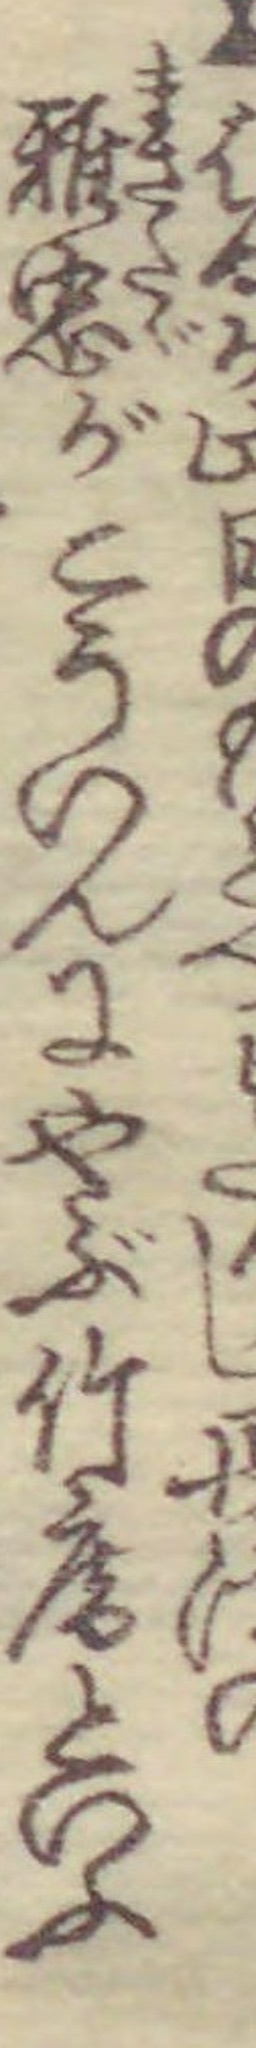雅志がこういんにやぶ竹庵といふ
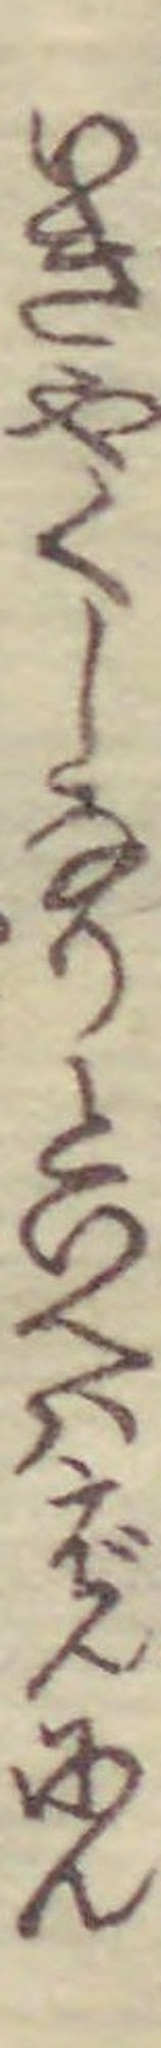いきやくしなりといへはばんにん
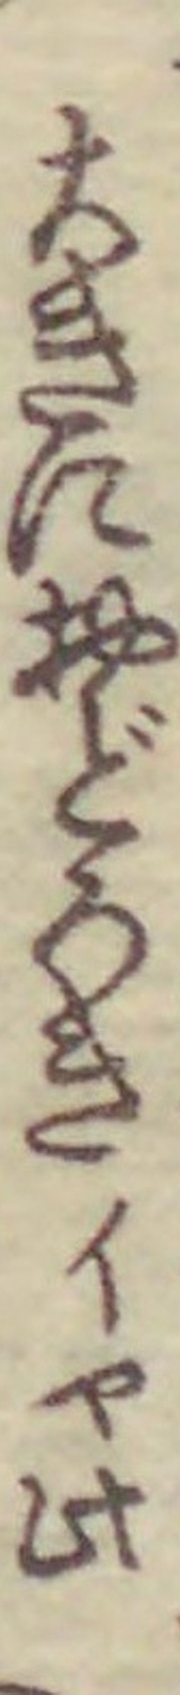大きにおどろきイヤ此
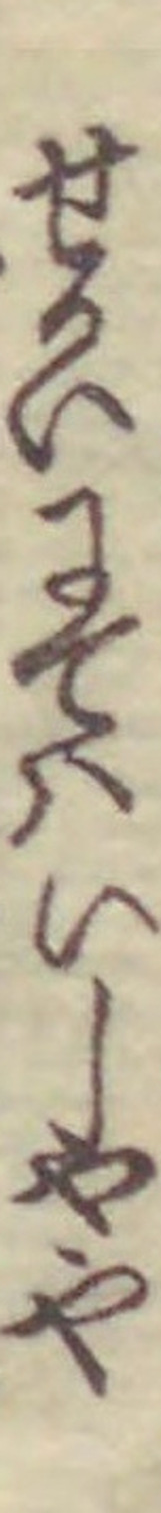せかいにてはいしやや
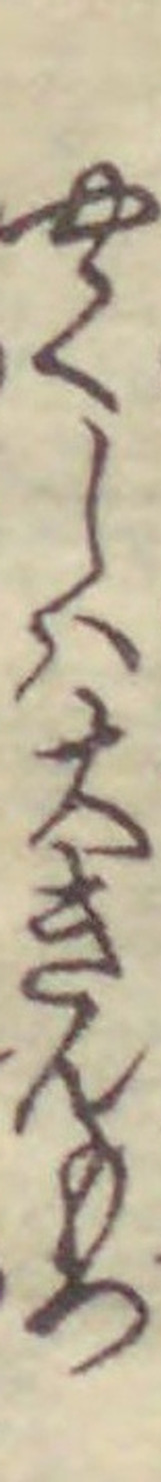やくしは大きんもつ
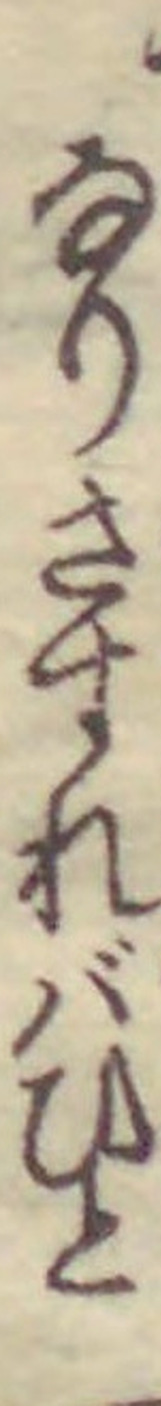なりさすればひと
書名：腹内窺機関 2巻
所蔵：国立国会図書館 National Diet Library, JAPAN
